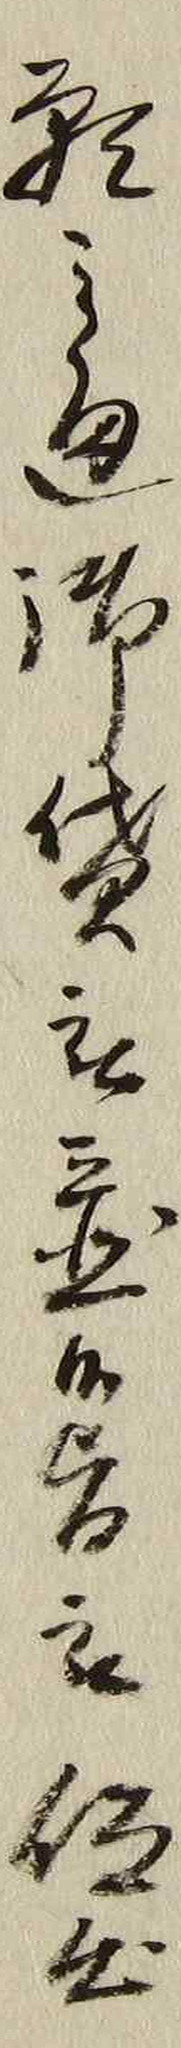願之通御貸被置候旨被仰出
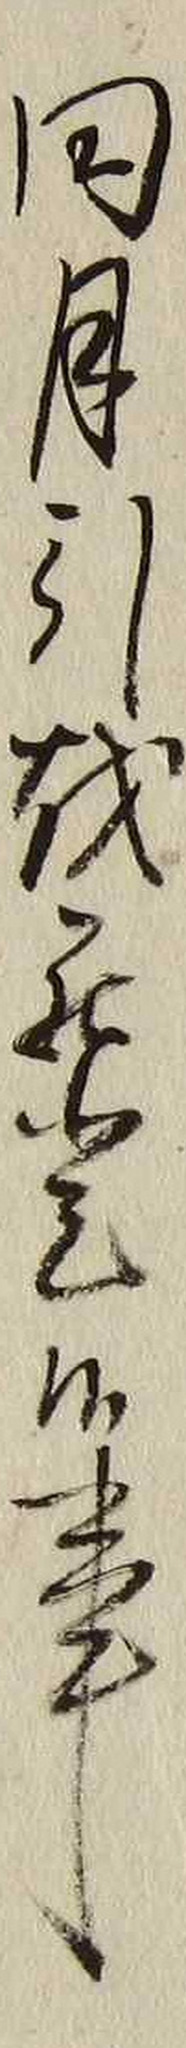同月引越罷登候事
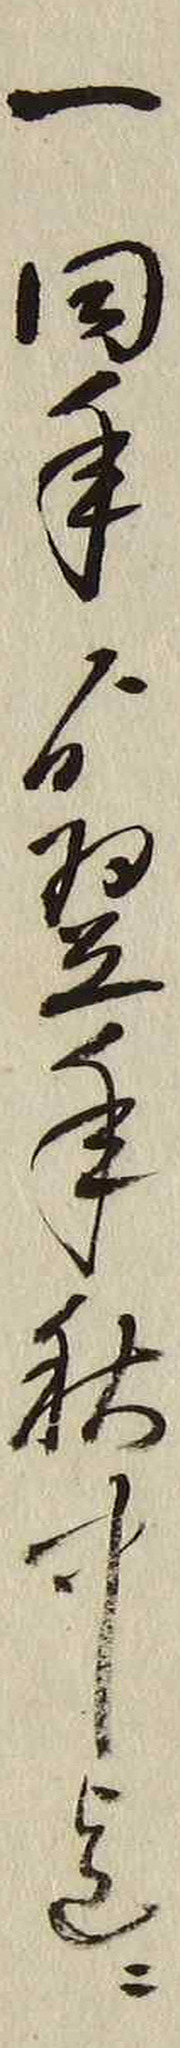一同年ゟ翌年秋中迄ニ
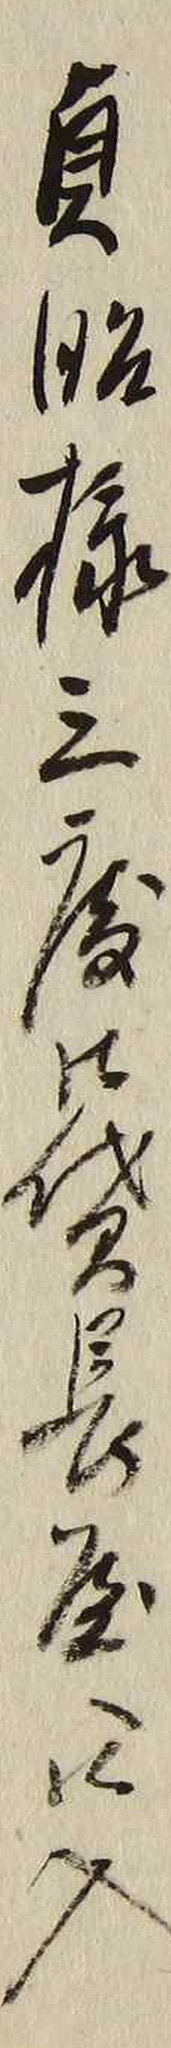貞昭様三度御貸長屋へ御入
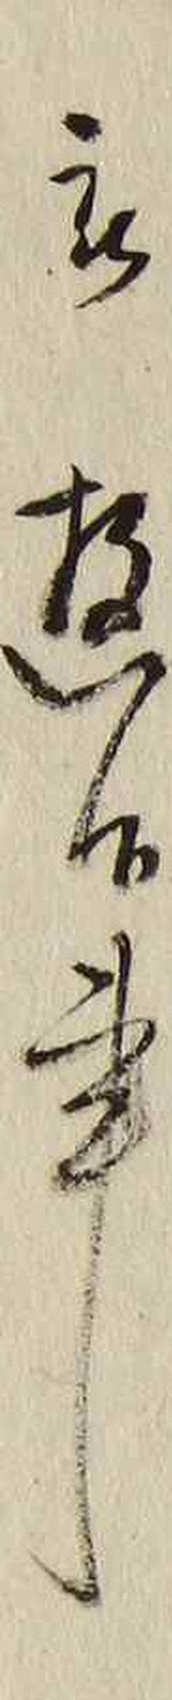被遊候事

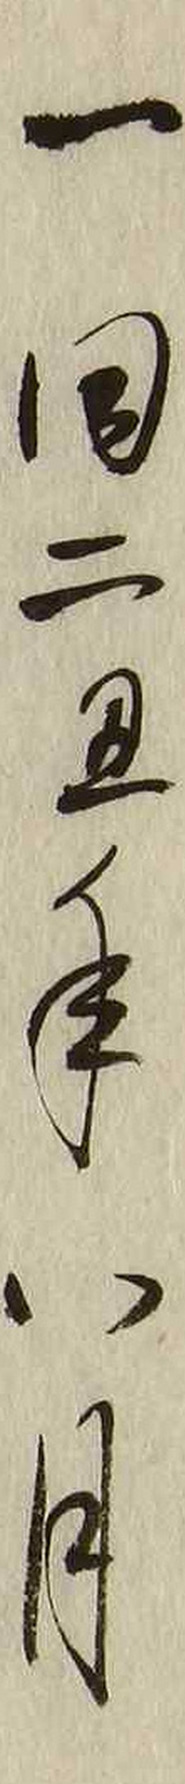一同二丑年八月
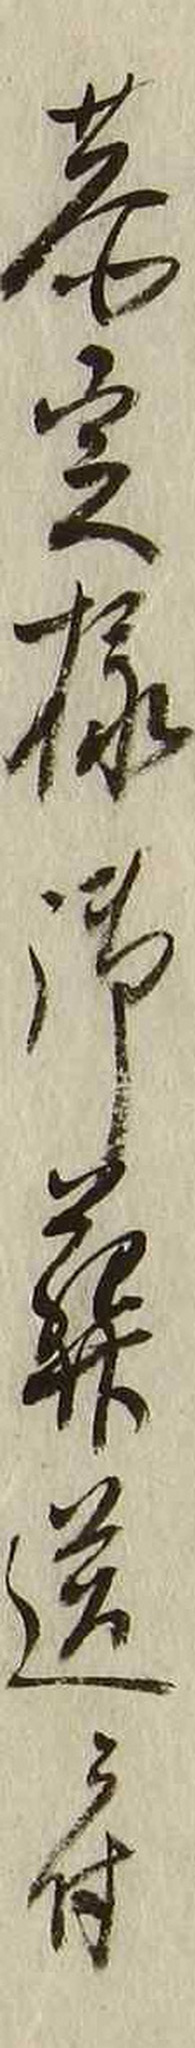恭定様御葬送ニ付
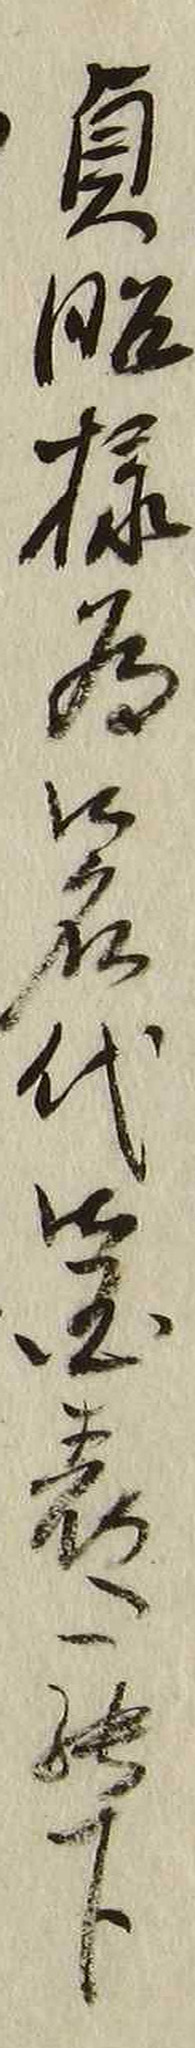貞昭様為御名代御国表へ罷下
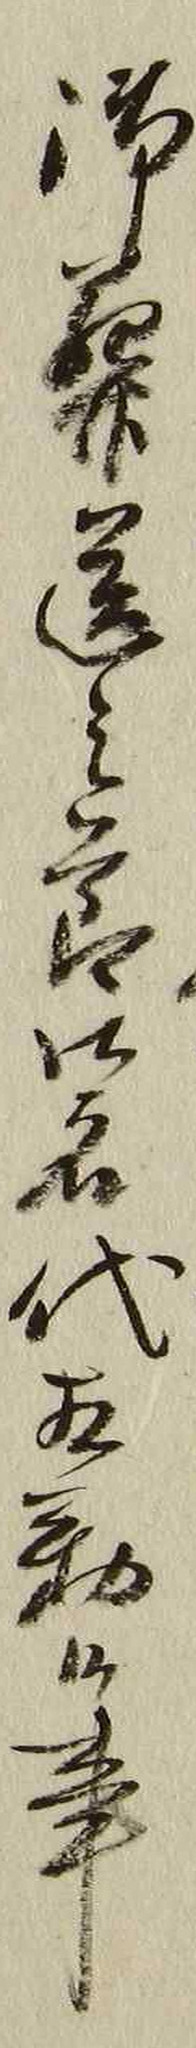御葬送之節御名代相勤候事
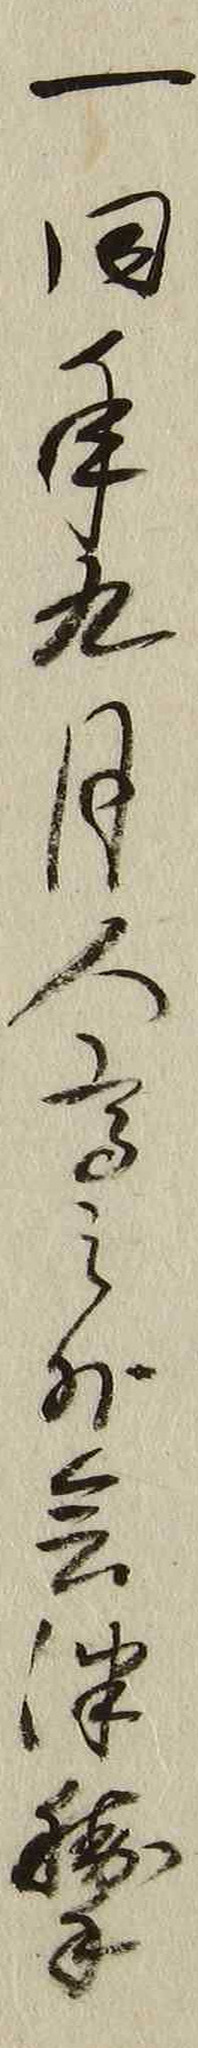一同年九月人高之外会津勝手
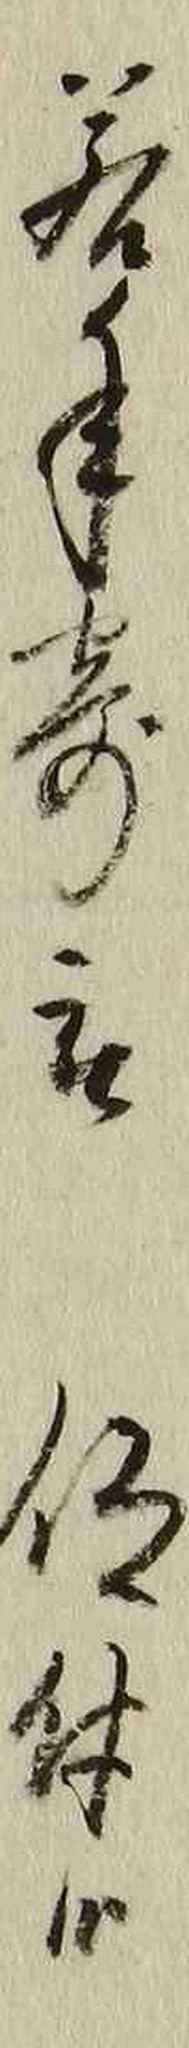若年寄被仰付候
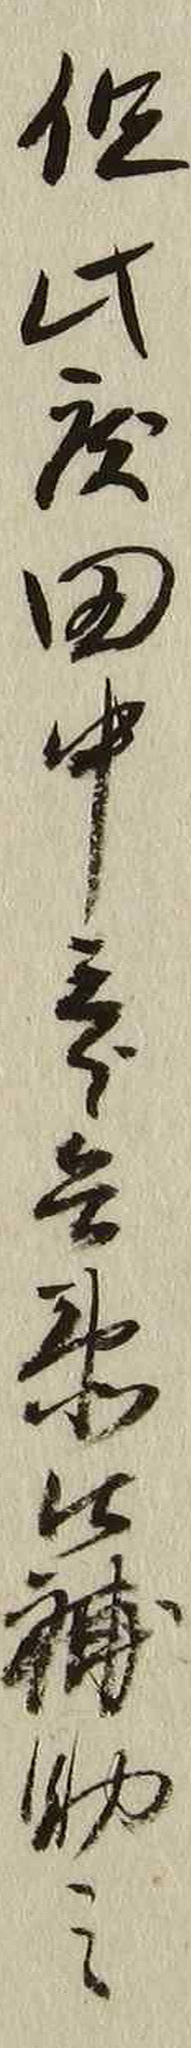但此度田中三郎兵衛御補助之
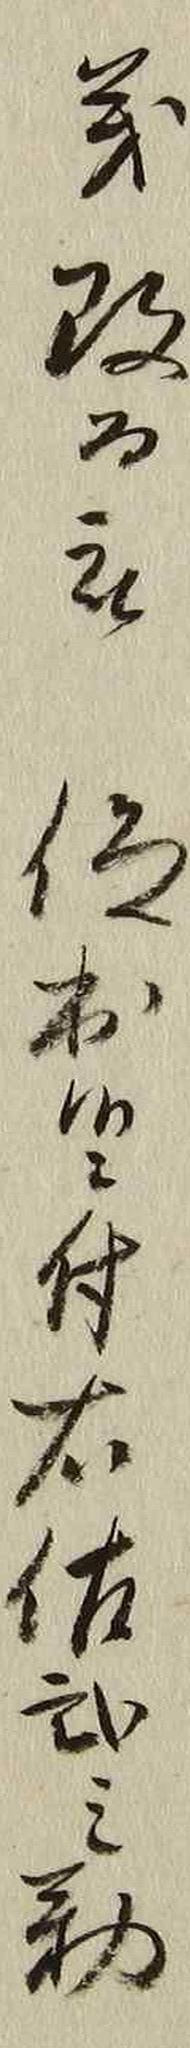義改而被仰出候ニ付右佐弐之勤
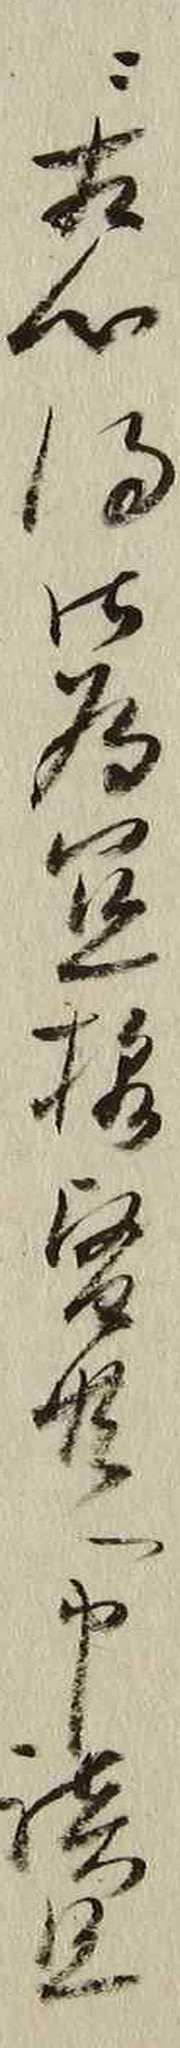ニ相心得御為宜様皆共へ申談且
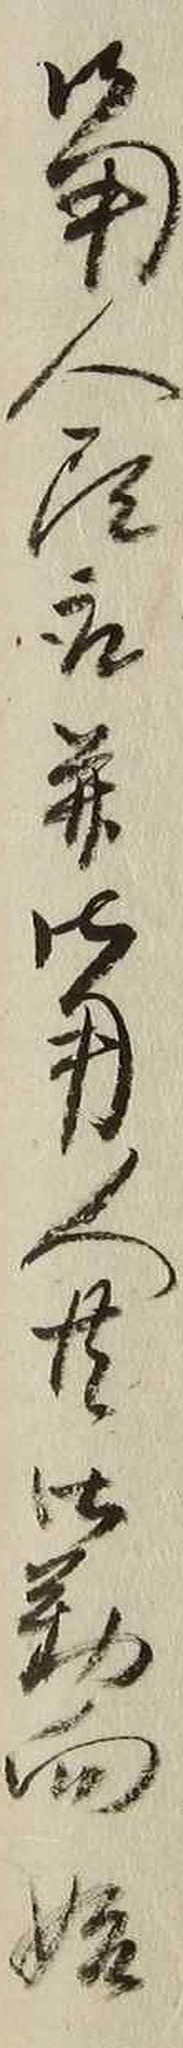御用人頭取并御用人共御勤向始
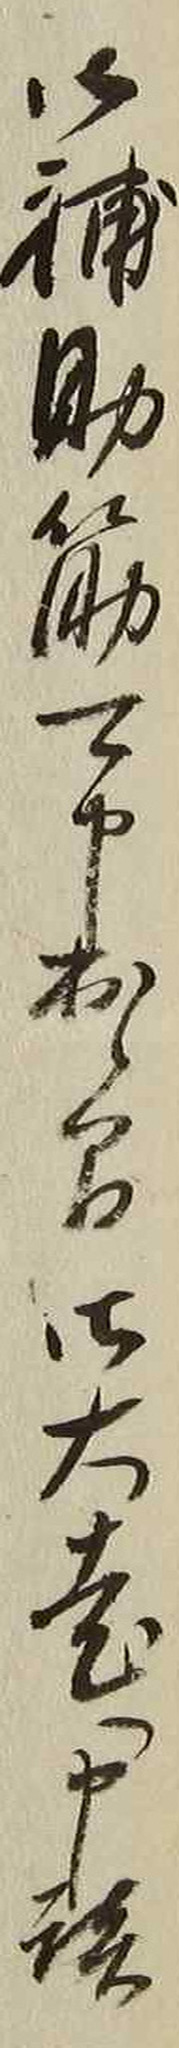御補助筋可申出候間御大老へ申談
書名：諸士系譜　巻之351　す之部1
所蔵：会津若松市立会津図書館
